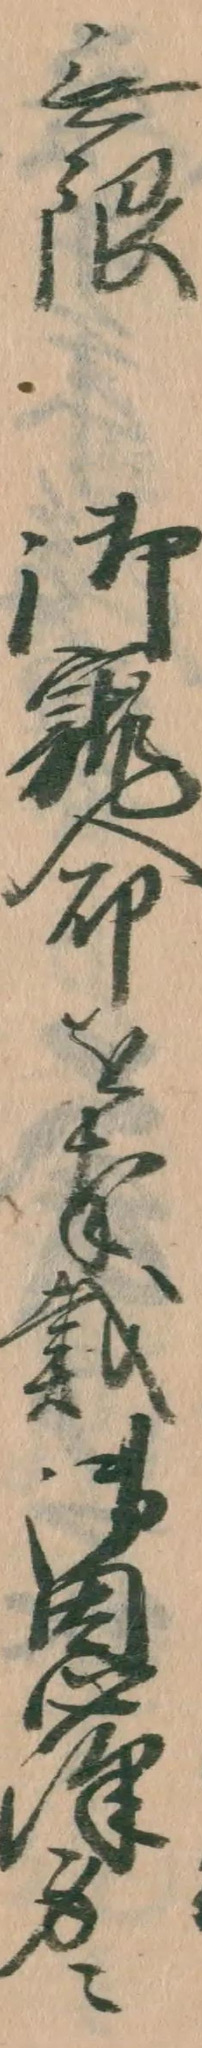無限御寵命を奉戴御恩沢身ニ
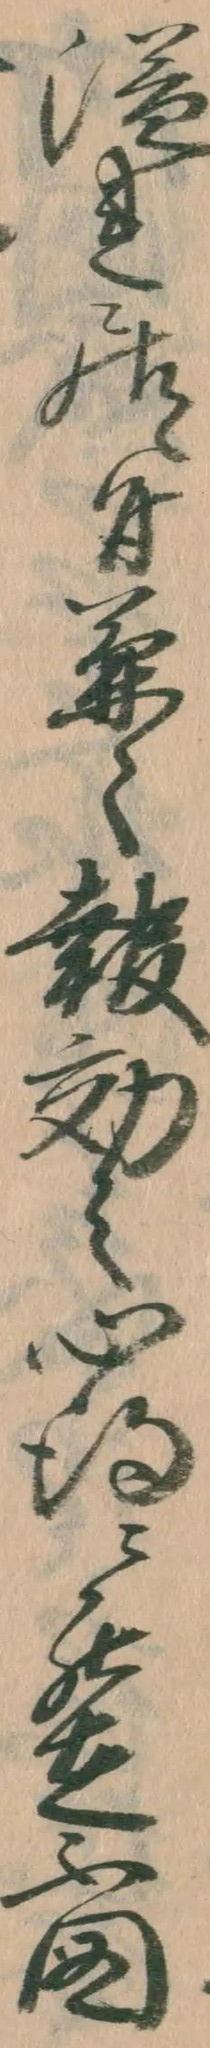溢れ居候付兼々報効之心得二罷在不図
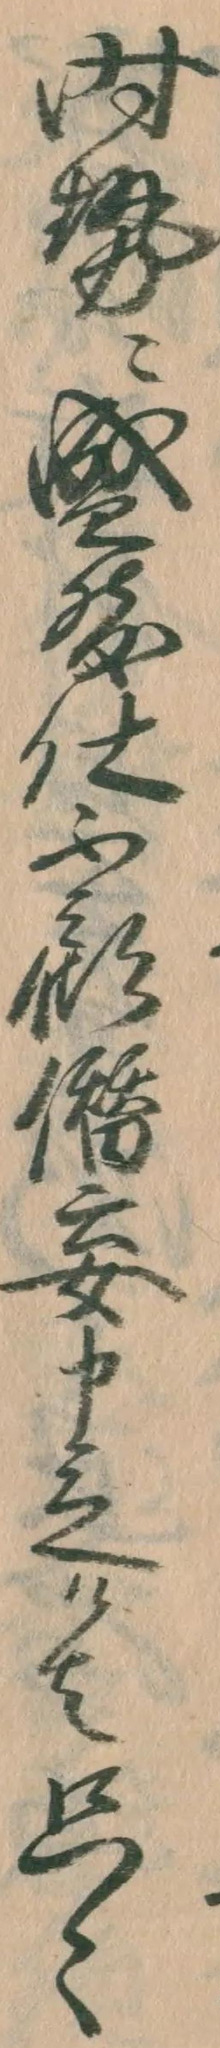時勢二盛発仕不顧僣妄申立候者只々
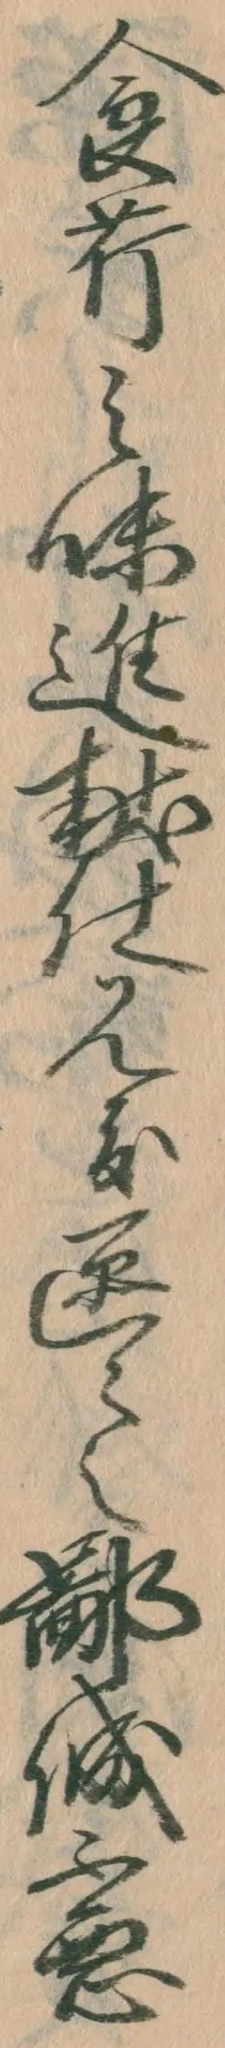食芹之味進献仕見度區々之鄙誠不悪
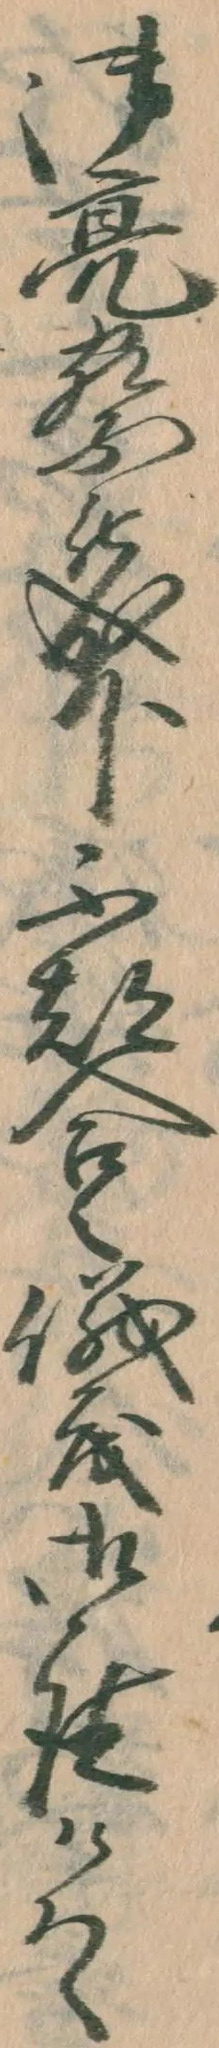御亮察被成下不都合之儀も御座候ハゝ
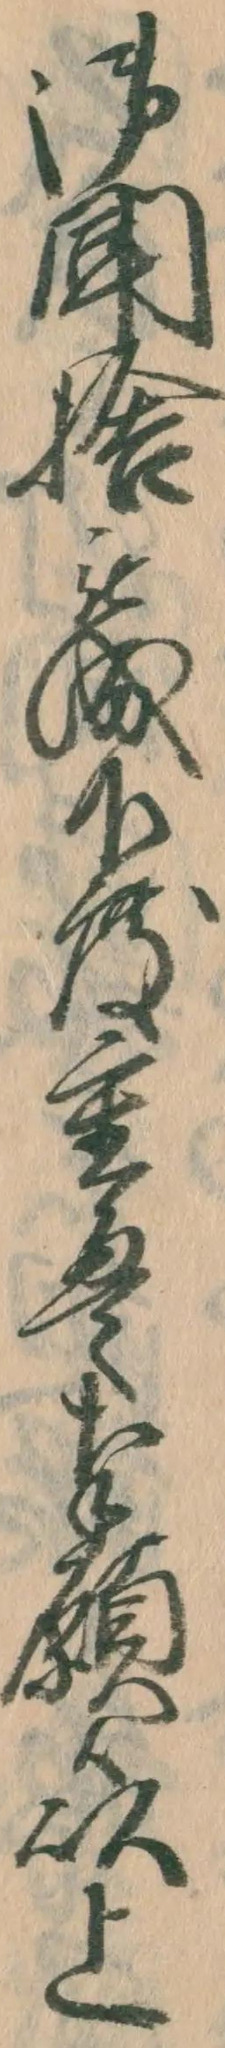御聞捨被成下度重畳奉願候以上
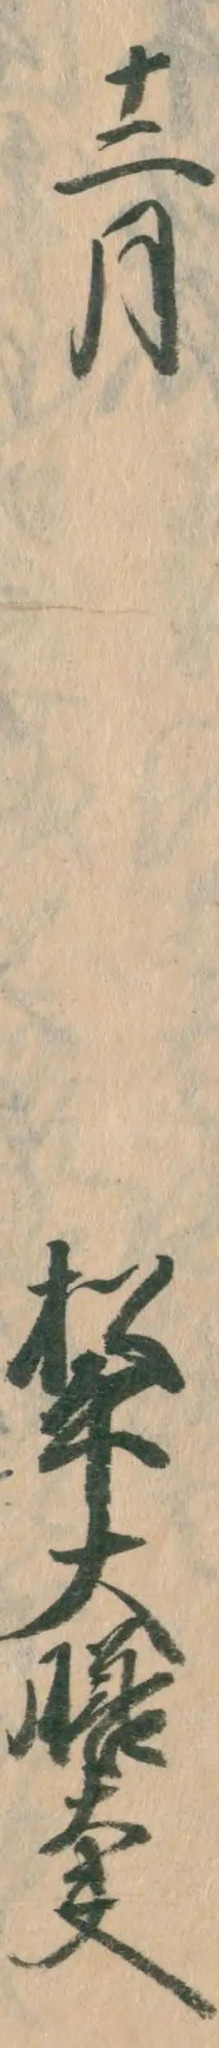十二月松平大膳大夫

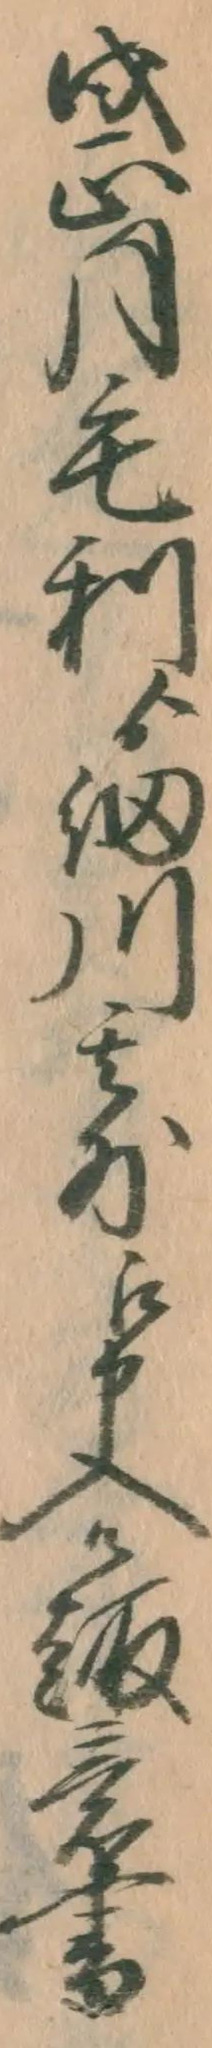戌正月毛利より細川其外江申入候趣意書
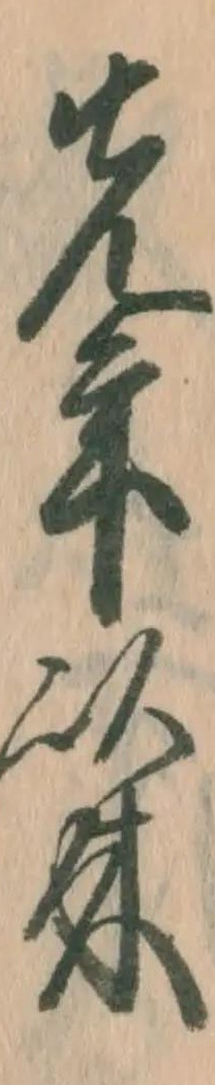先年以来
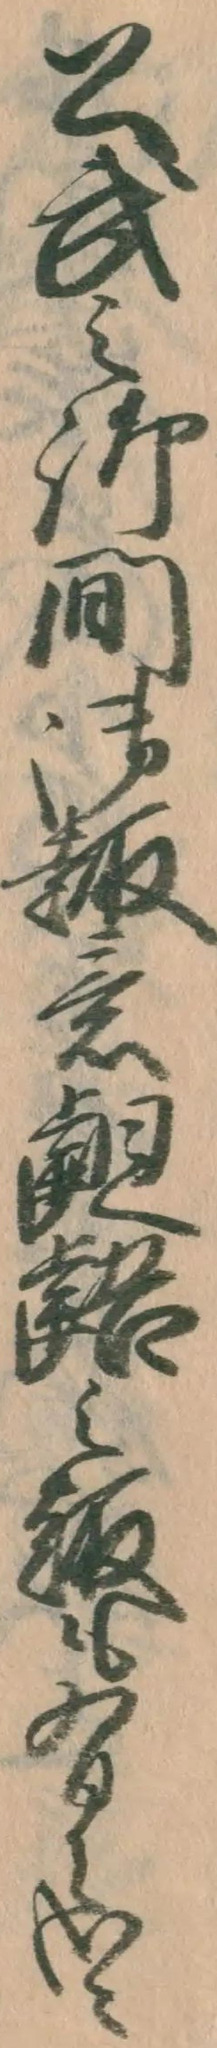公武之御間御趣意齟齬之趣も有之哉二
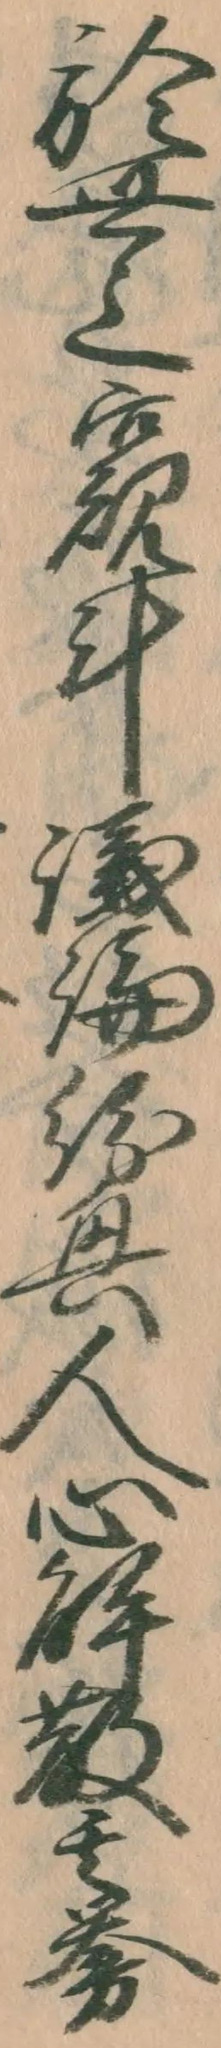於世上窺斗議論紛興人心解散其釁
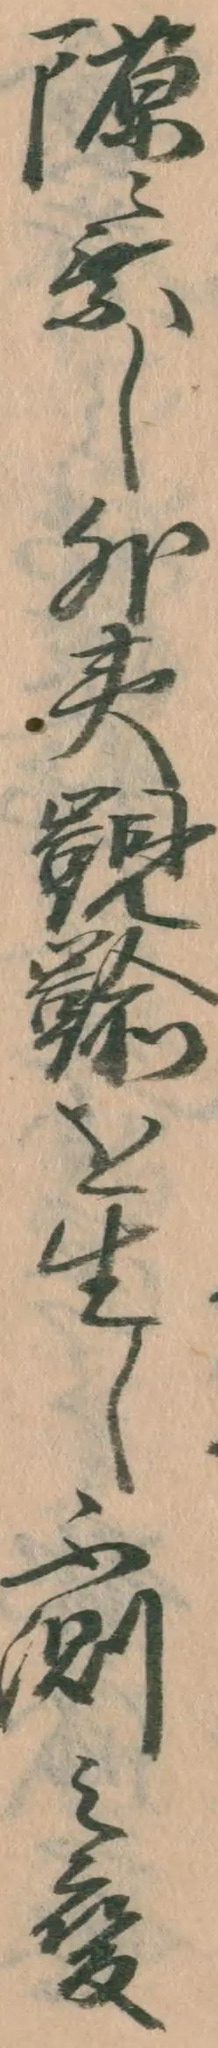隙二乗し外夷覬覦を生し不測之変
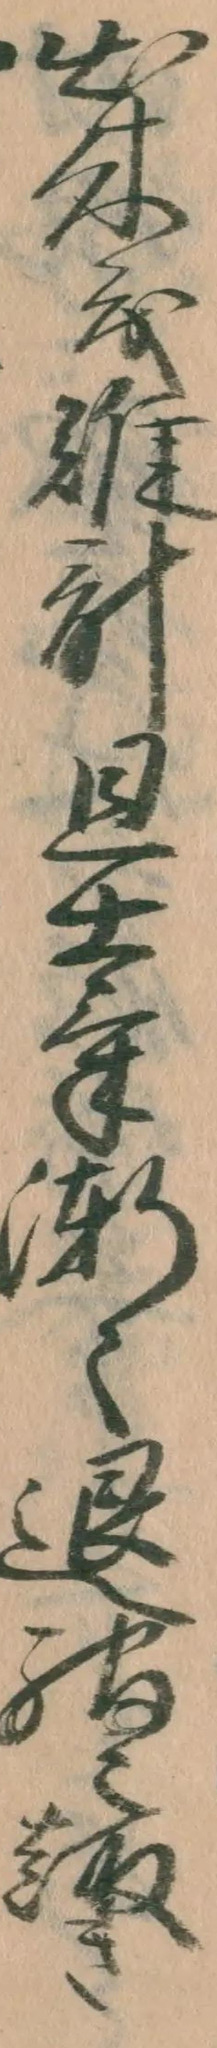出来も難計且士気漸々退縮之趣き
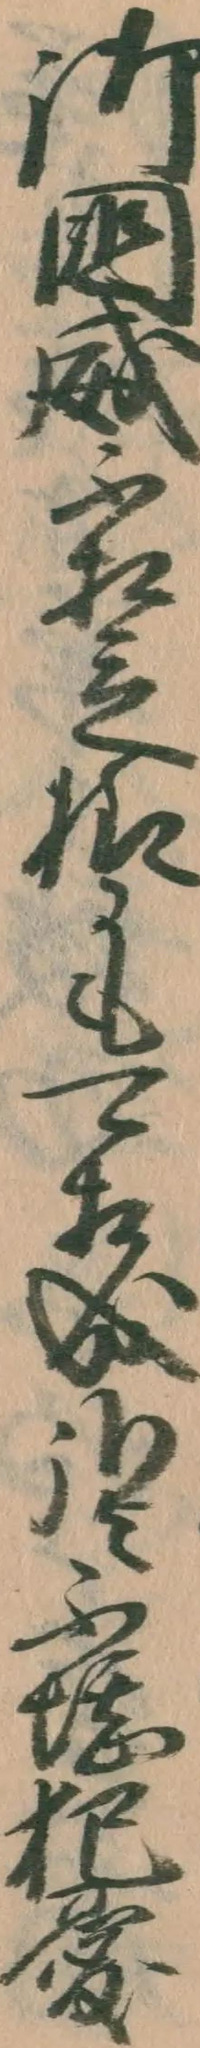御国威不相立様にも相成哉と不堪杞憂
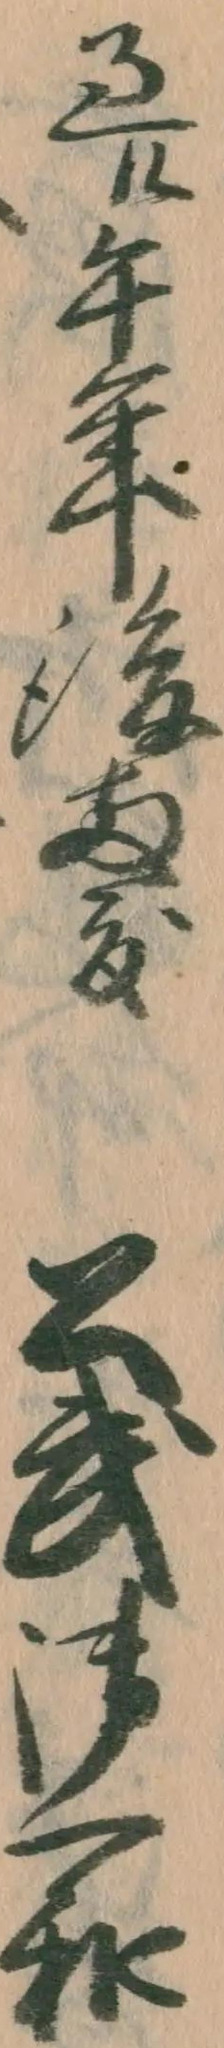過ル午年後両度公武御一和
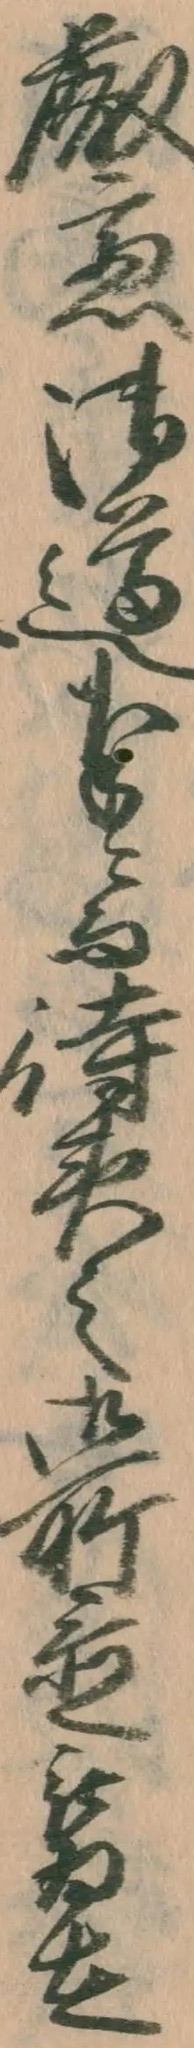叡慮御遵奉二而待夷之御所置被為在
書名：麗斎叢書. 20
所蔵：国立国会図書館 National Diet Library, JAPAN
